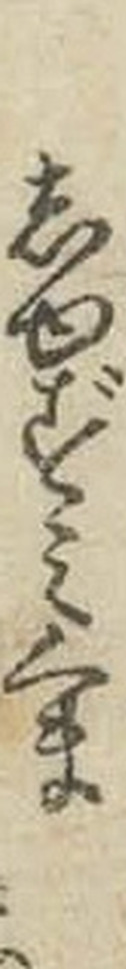しゆずみくま
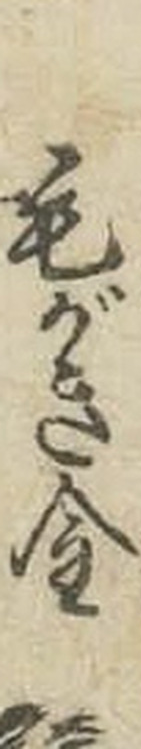毛がき金
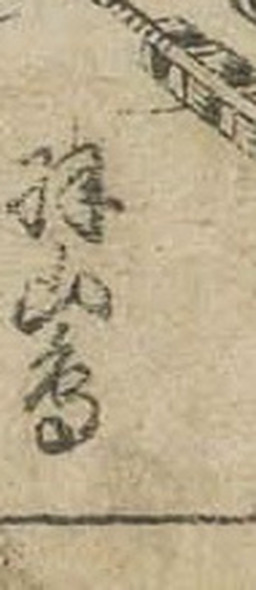羽山鳥
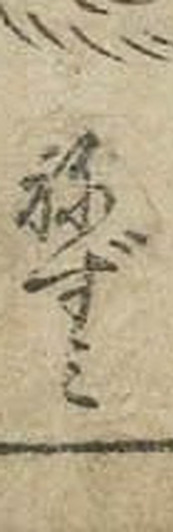ねずみ
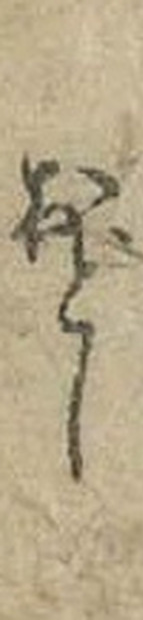おどし

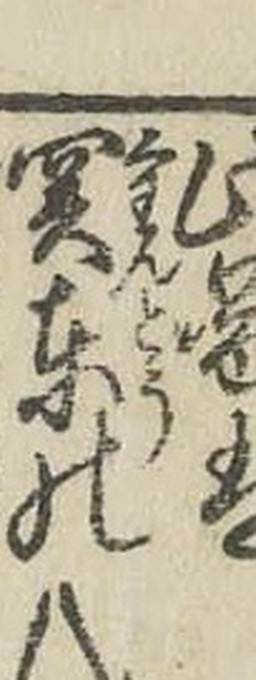関東の
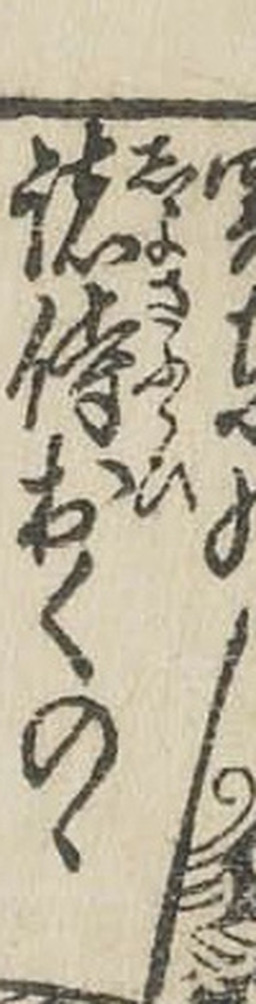諸侍おくのゝ
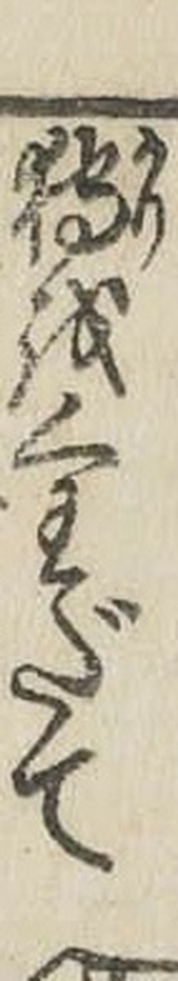狩をくわだて
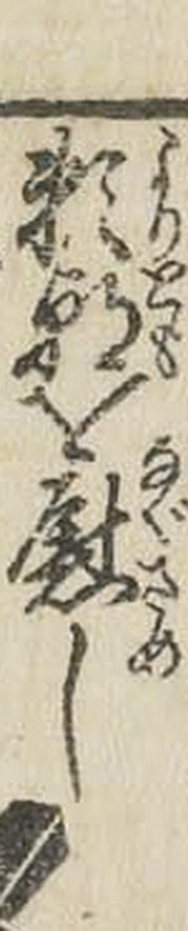頼朝を慰し
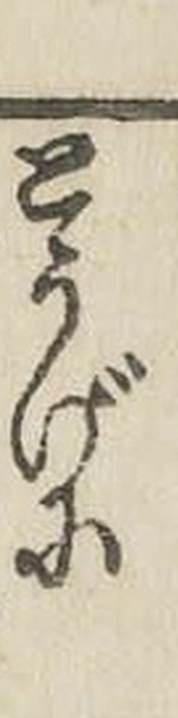とうげに
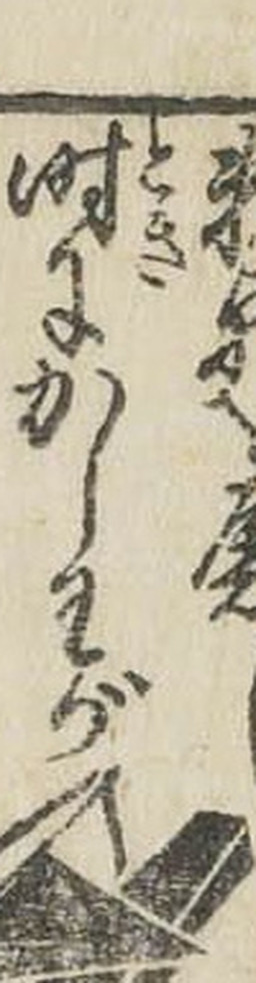時にかしわが
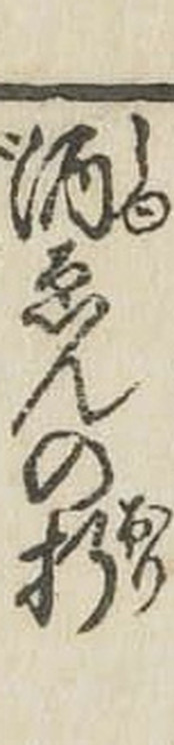酒ゑんの折
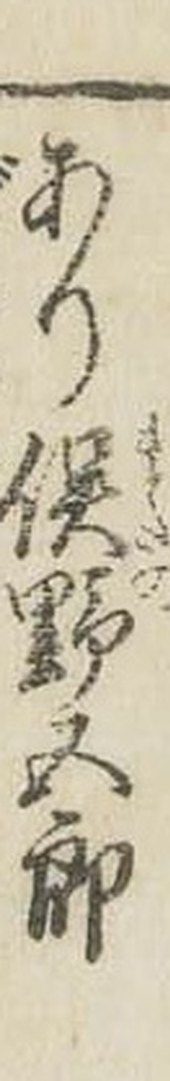あり俣野五郎
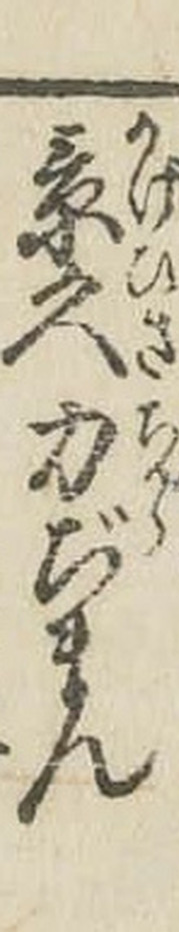景久力ぢまん
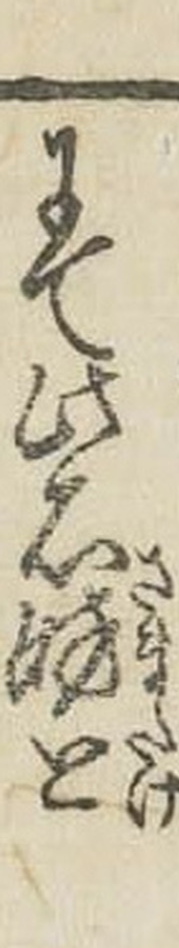にて此石妨と
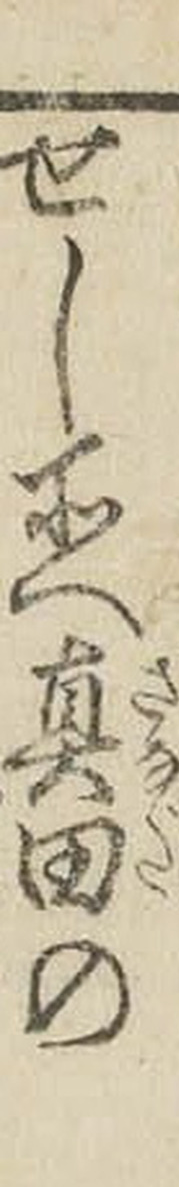せし所へ真田の
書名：絵本写宝袋 9巻 3之巻
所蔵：東京学芸大学教育コンテンツアーカイブ
